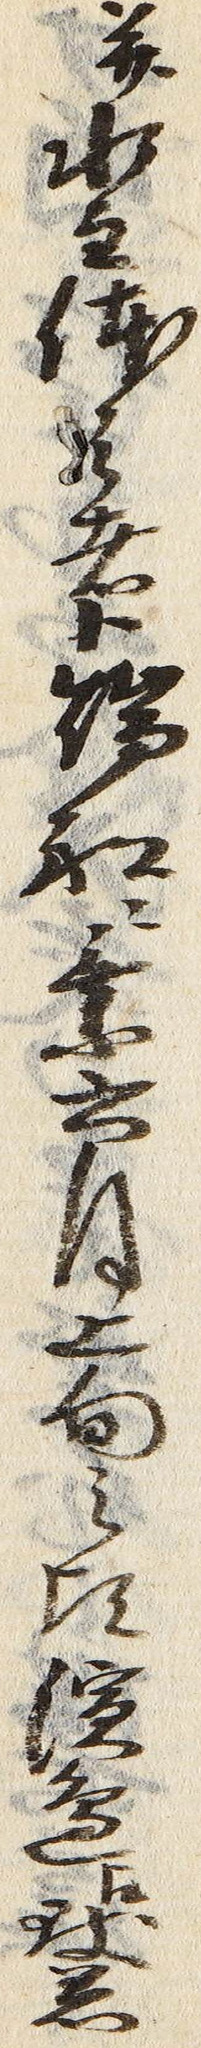幷水主体之者共ト端舩ニ乗六月上旬之比濱邊江致着
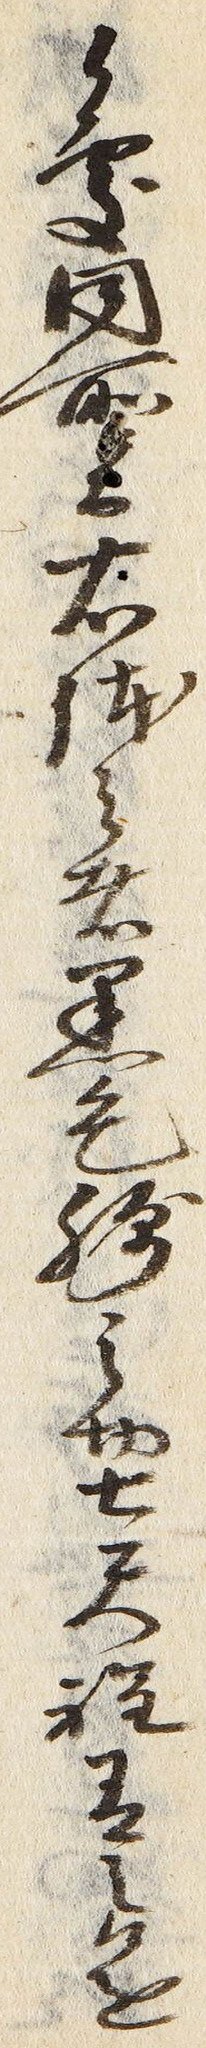候處同所ニ而右体之者黒毛綿之切七尺程有之候を
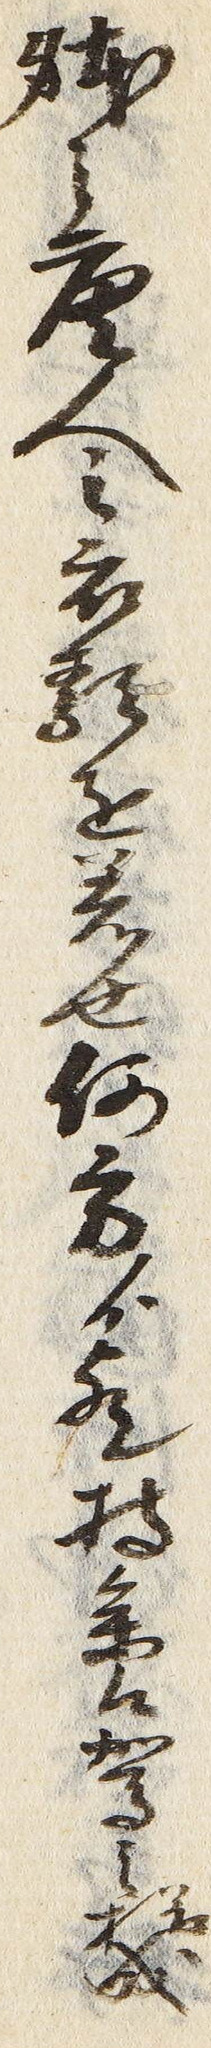躰之唐人之衣類を着せ何方ゟ欤持参候駕之様成
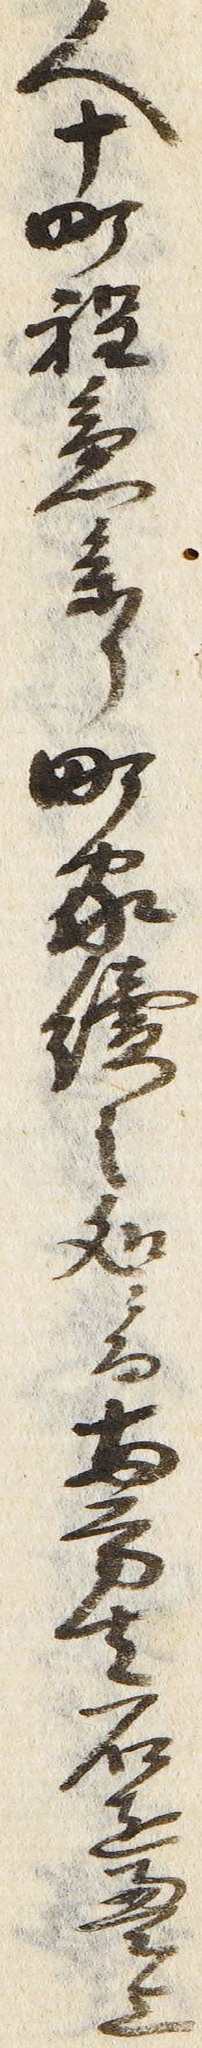人十町程急参り町屋續之処ニ而両方者石を畳上
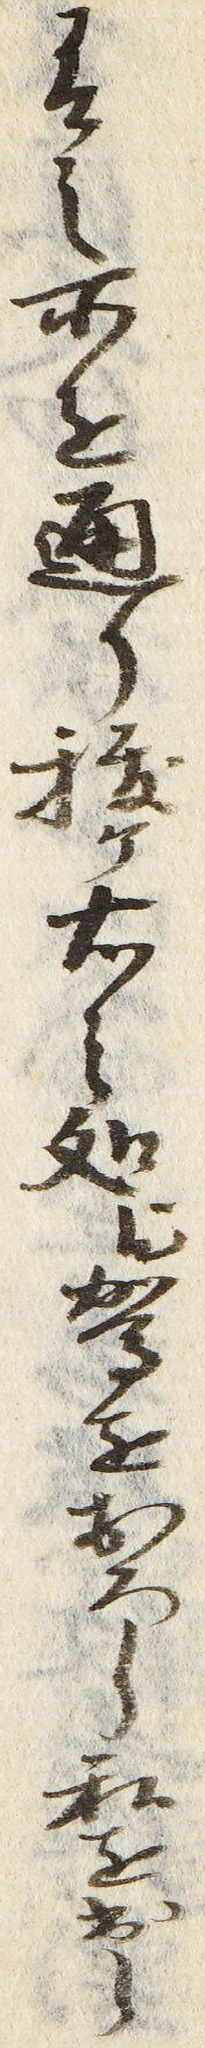有之所を通り抜ケ右之処江駕をおろし私を出し
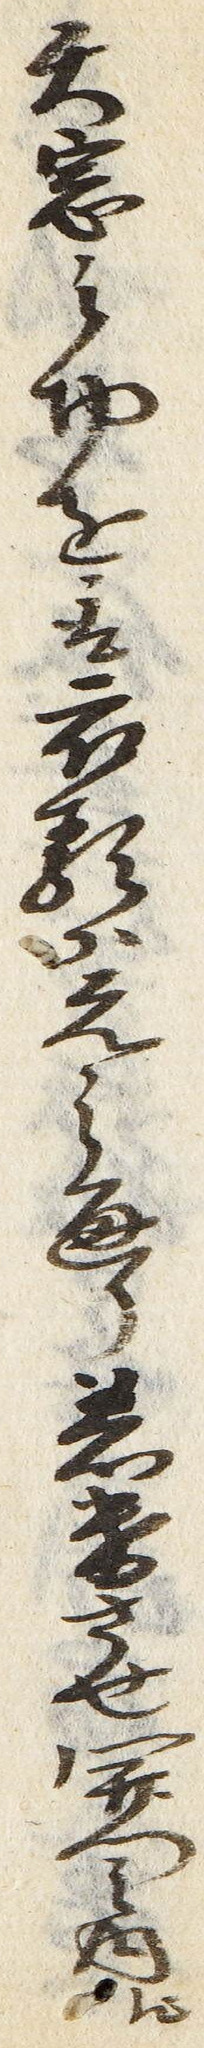天窓之切を取衣類ハ元之通り着替させ開門之内江
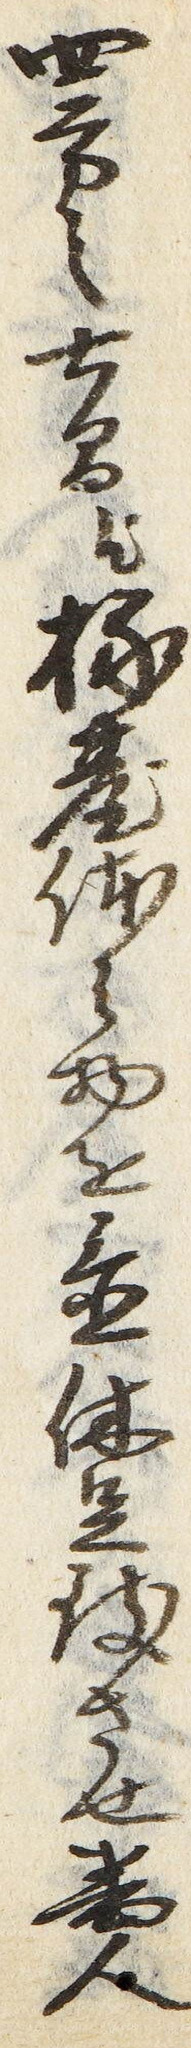四方之土間江椽臺体之物を置休足致させ番人

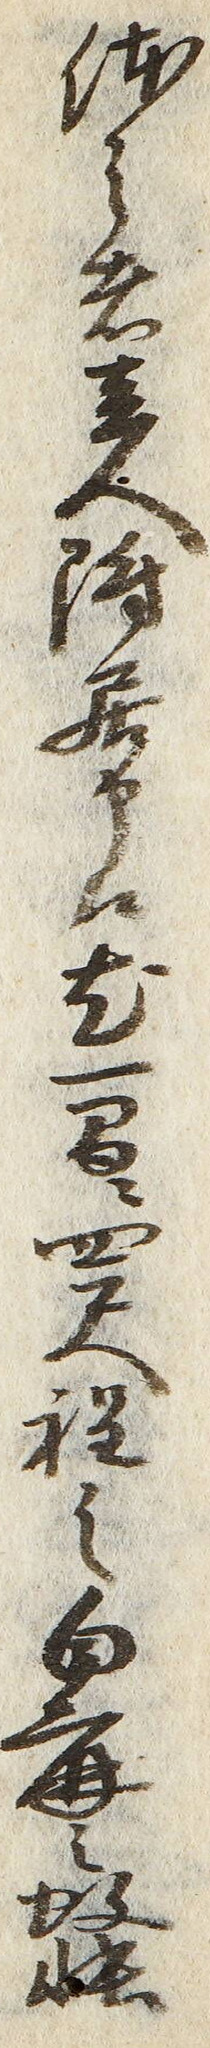体之者壱人附居申候尤一間ニ四尺程之白麻之蚊帳
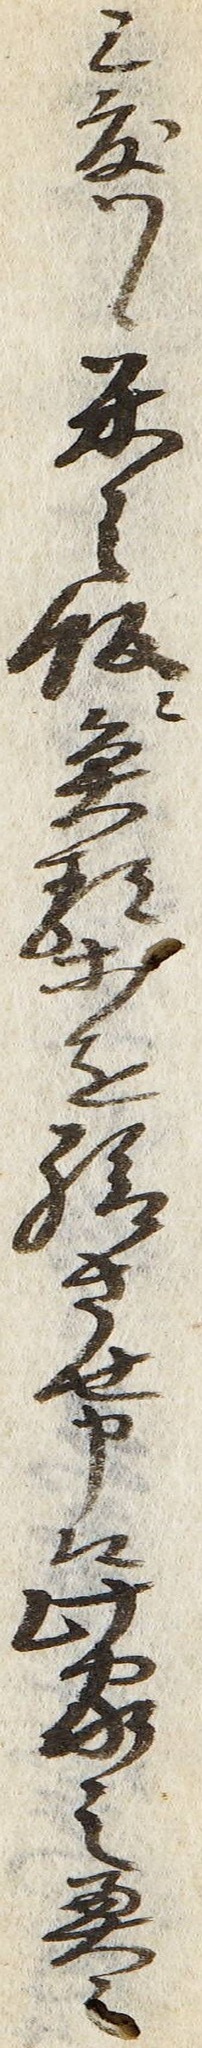三度ツヽ米之飯ニ𩵋類等を給させ申候此家之奥之
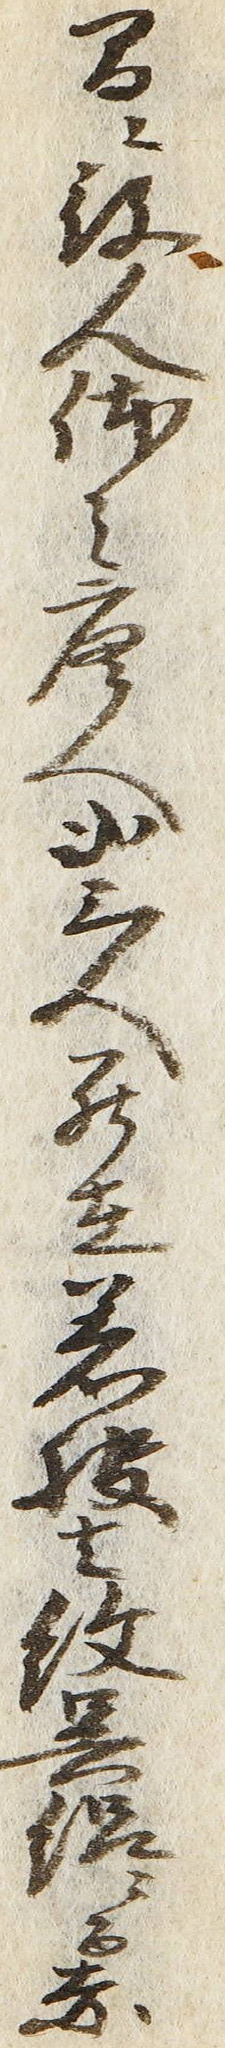間ニ役人体之唐人弐三人罷在着服者紋呉絽ニ而赤
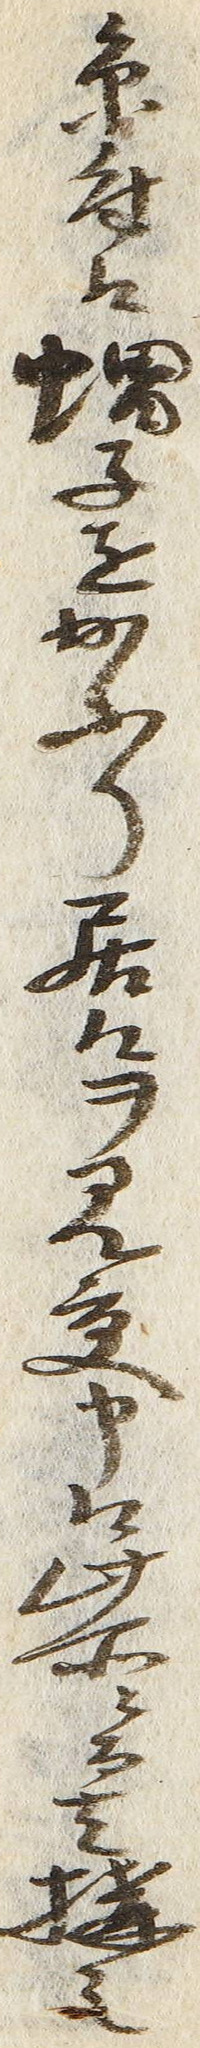糸付候帽子をかふり居候ヲ見受申候此所ニ而者構之
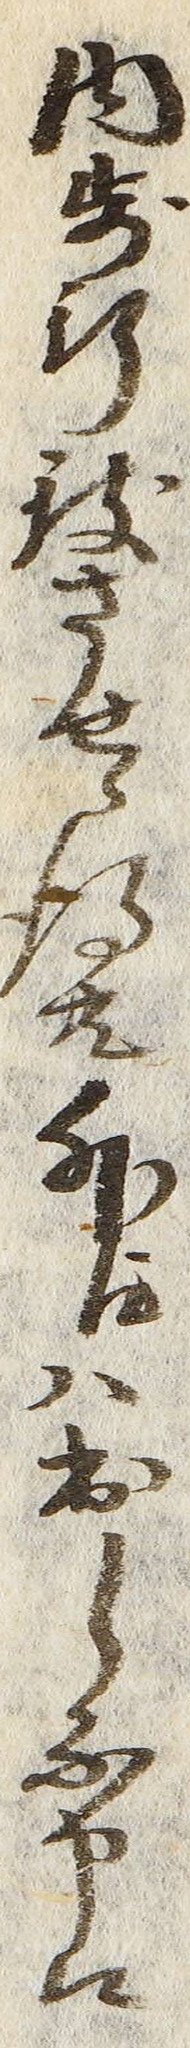内歩行致させ候得共外江は出し不申候
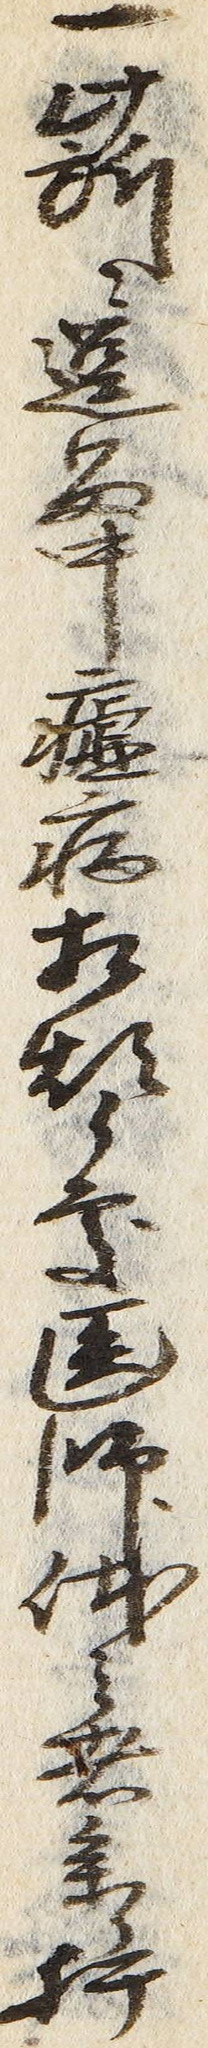一此所ニ逗留中瘧病相煩候處医師体之者参り肝
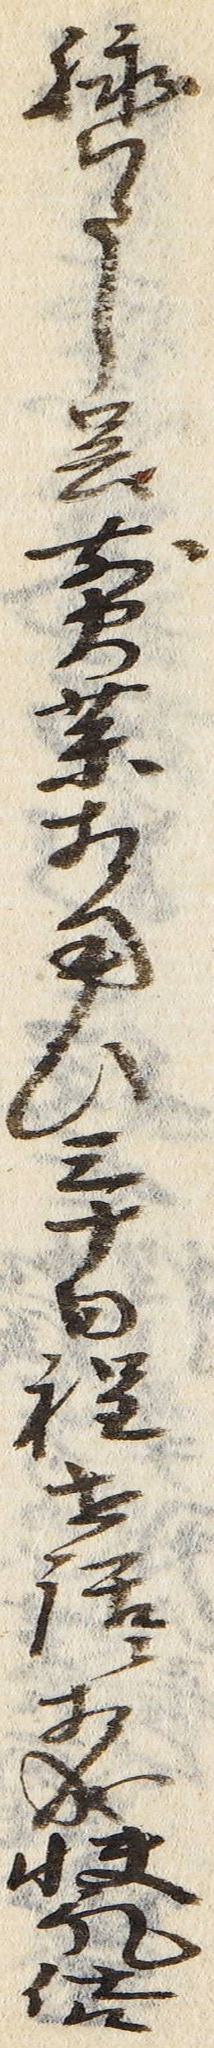脈いたし呉煎薬相用ひ三十日程世話ニ相成快気仕候
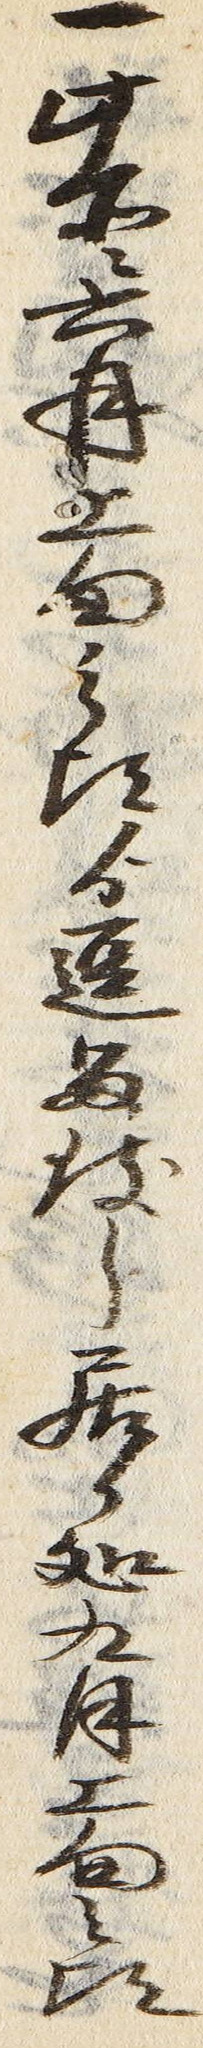一此所ニ六月上旬之比ゟ逗留致し居候処九月上旬之比
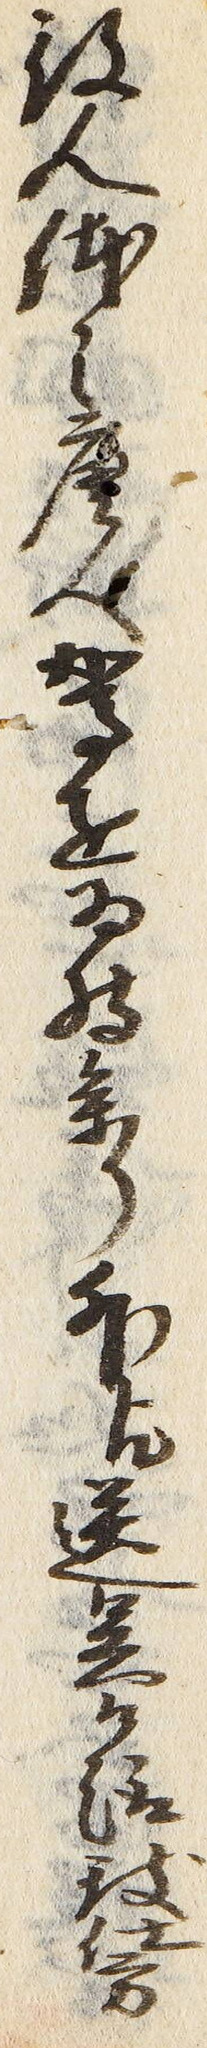役人体之唐人駕を為持参リ外江送呉候趣致仕方
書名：漂流人善助聞書
